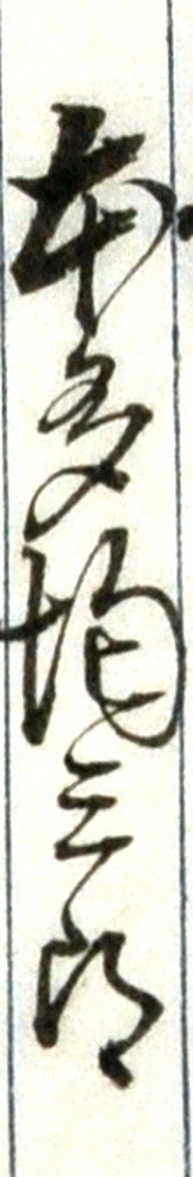本多均三郎
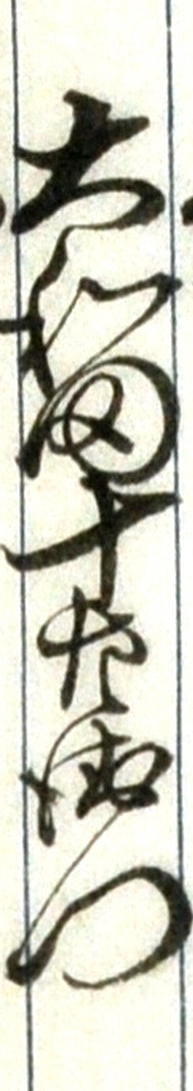大和田十左衛門
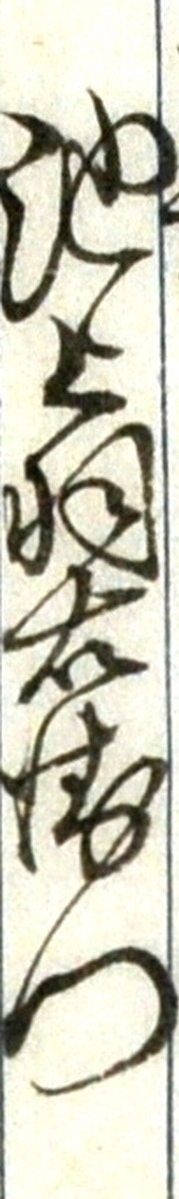池上羽右衛門

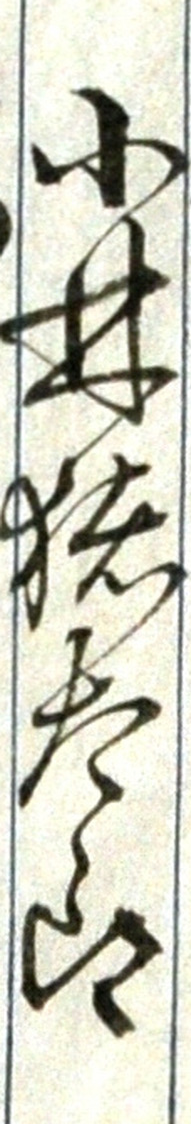小林猪太郎
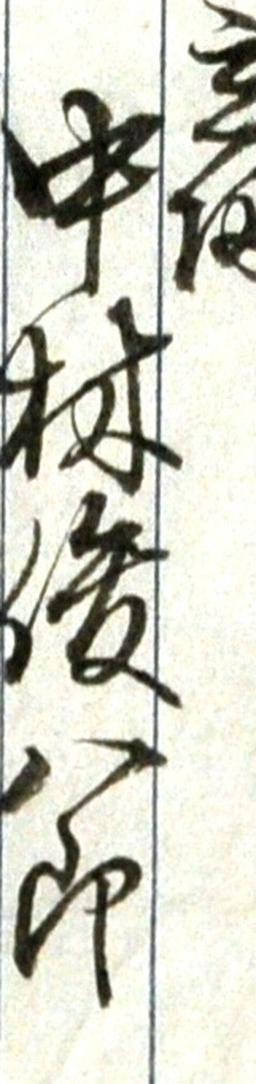中林俊八郎
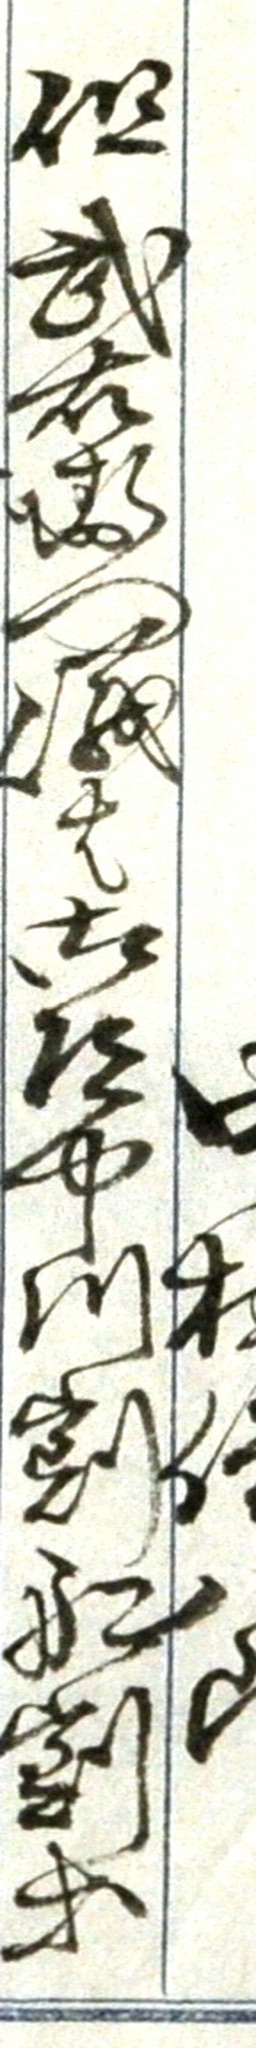但武右衛門儀者御道中川割船割等
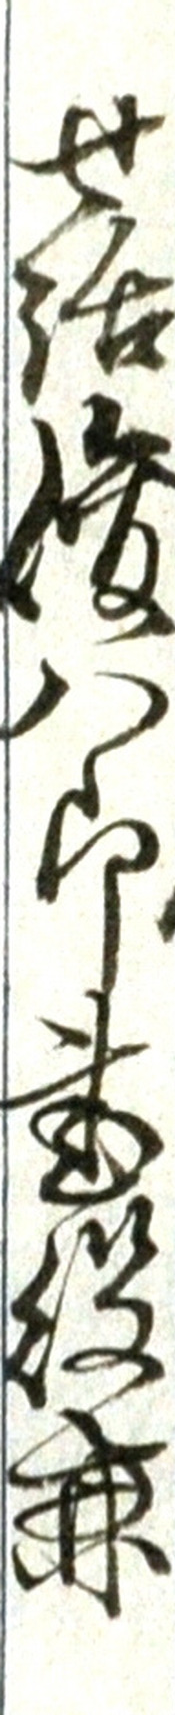世話俊八郎書役兼
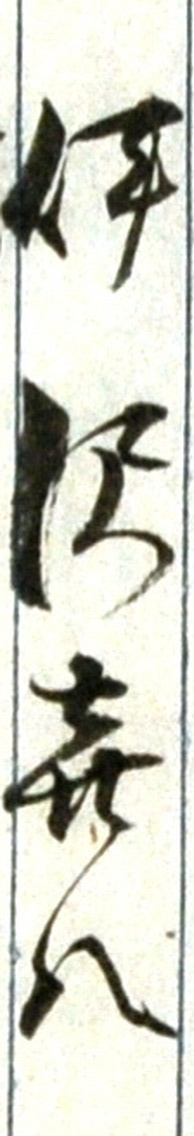伊沢喜八
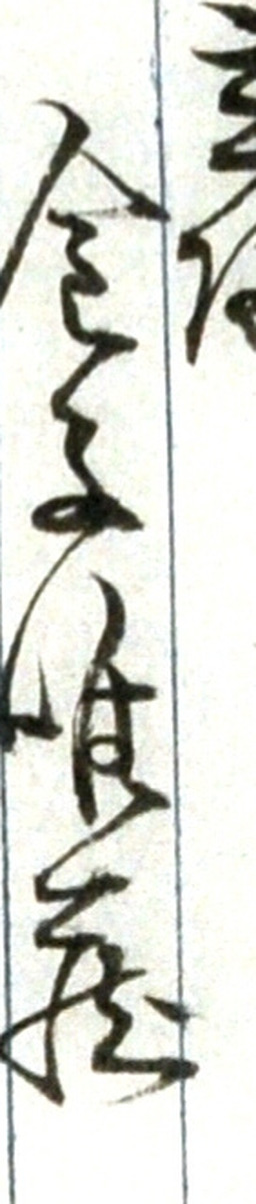金子唯蔵

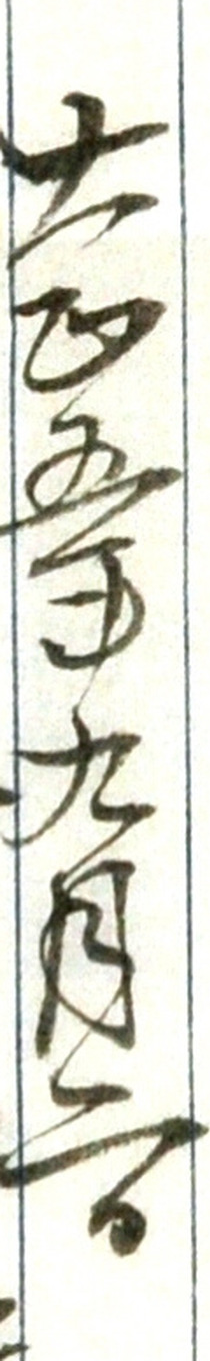大正五年九月二日
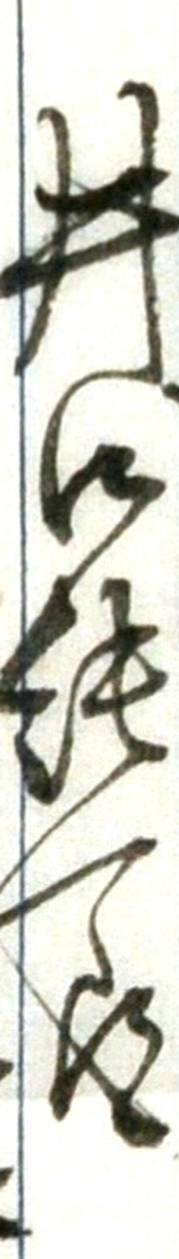井口純一郎
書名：頼直公御初入御供立之内御迎之覚
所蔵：伊那市立高遠町図書館・合同会社AMANE
